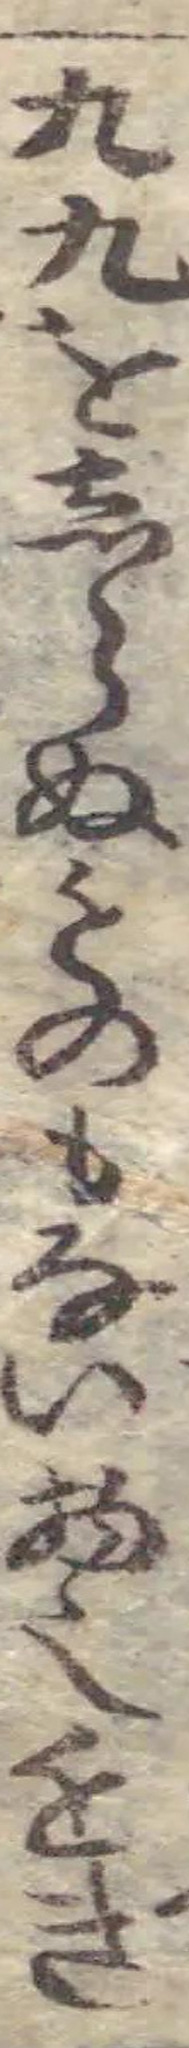九九をしらぬものもない物也近き
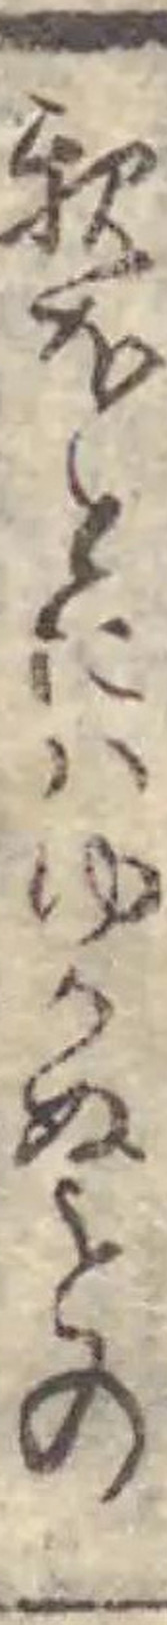親ほとにはゆかぬもの
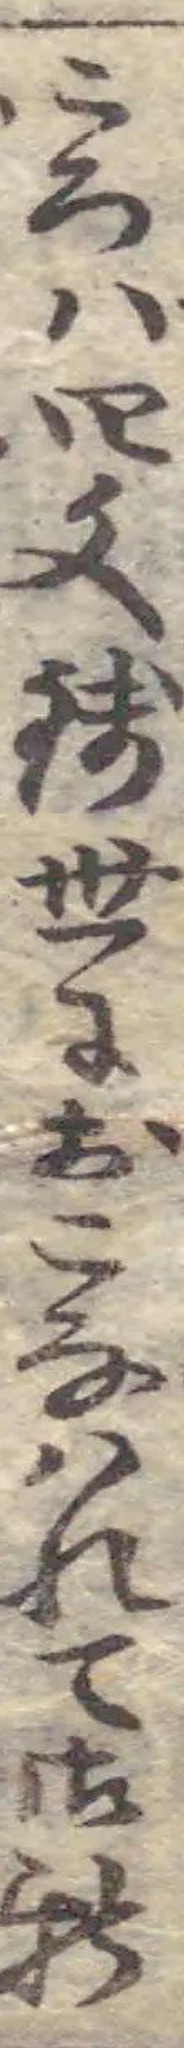ころは四文銭世におこなはれて御新
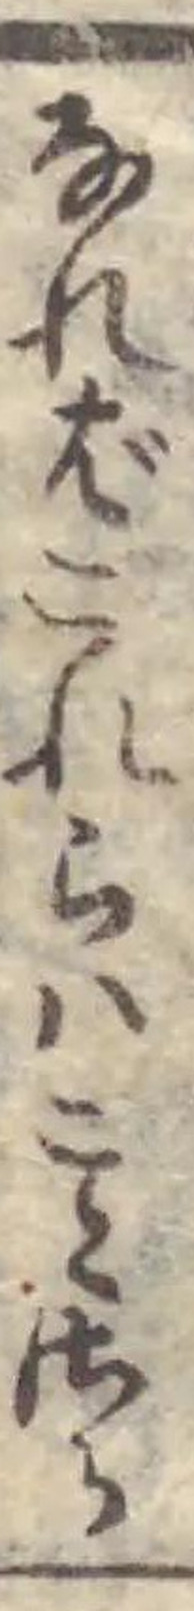なればこれらはことさら
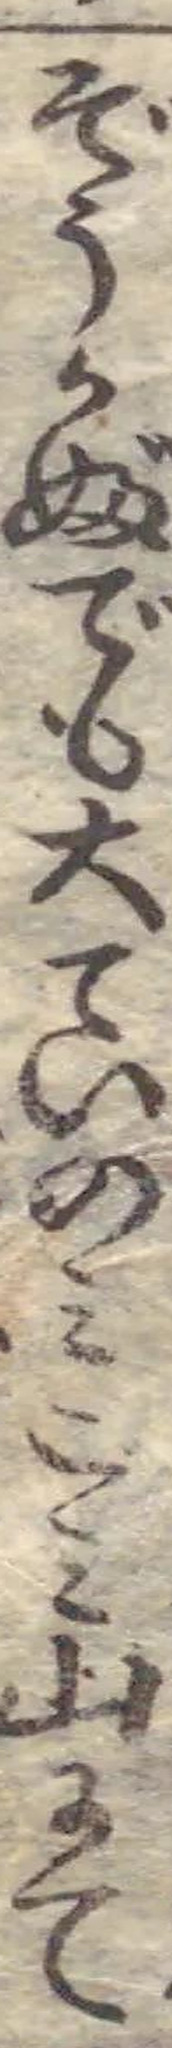ぞうかぶでも大ていのみこみ山にて
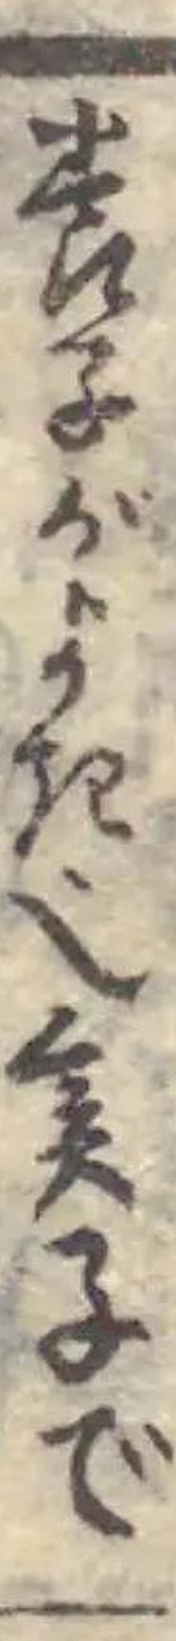養子がよき也実子で
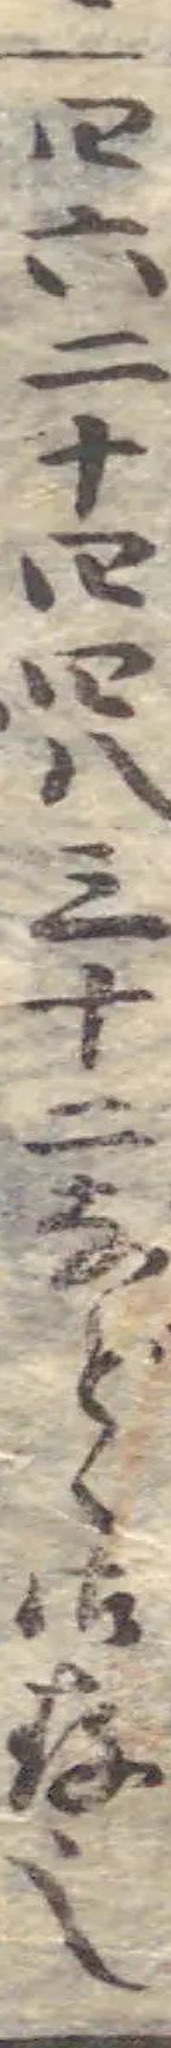四六二十四四八三十二などゝ御存也
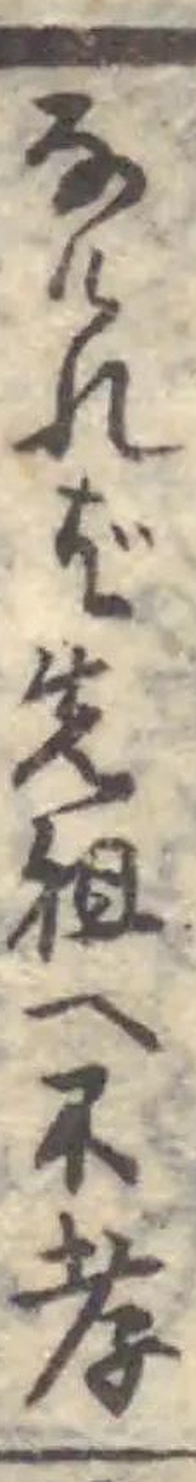なければ先祖へ不孝
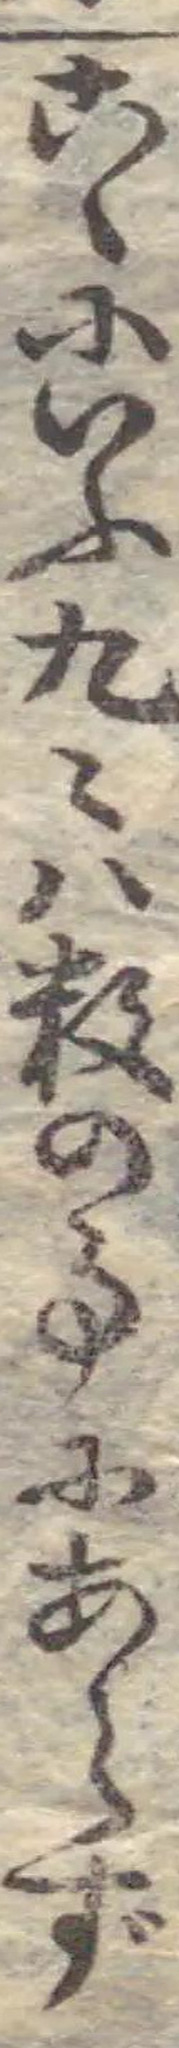こゝにいふ九々は数の事にあらず
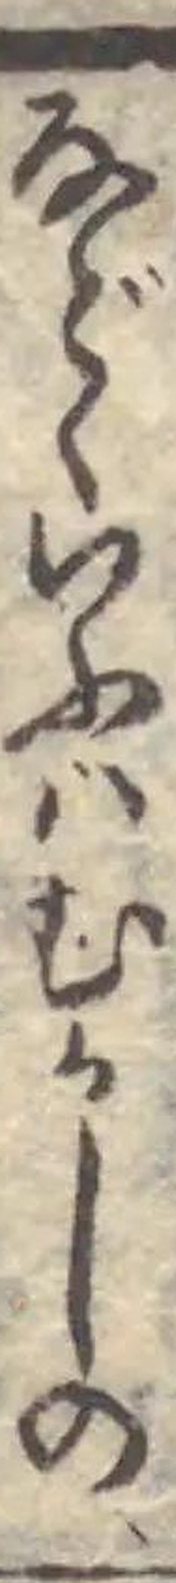などゝいふはむかしの
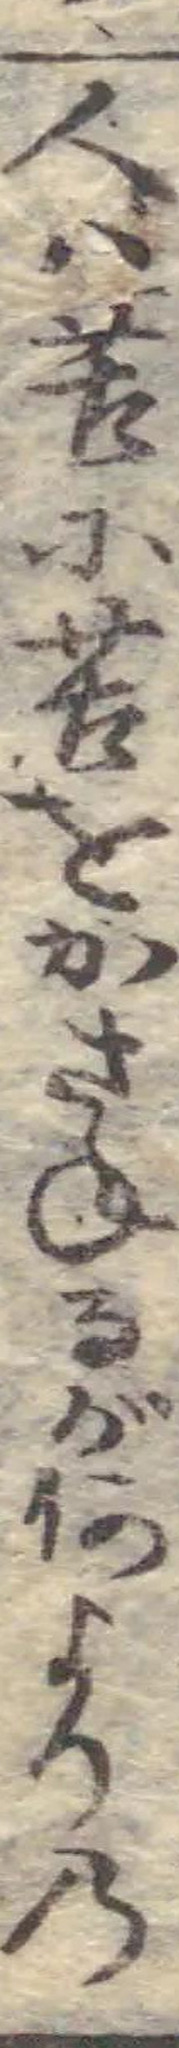人は苦に苦をかさねるが何よりの
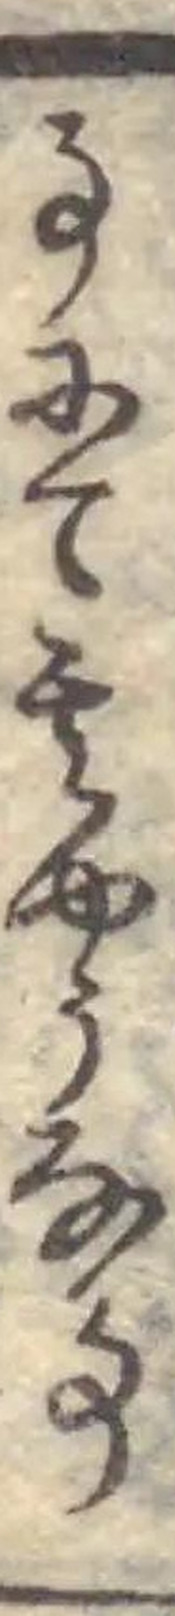事にて其やうな事
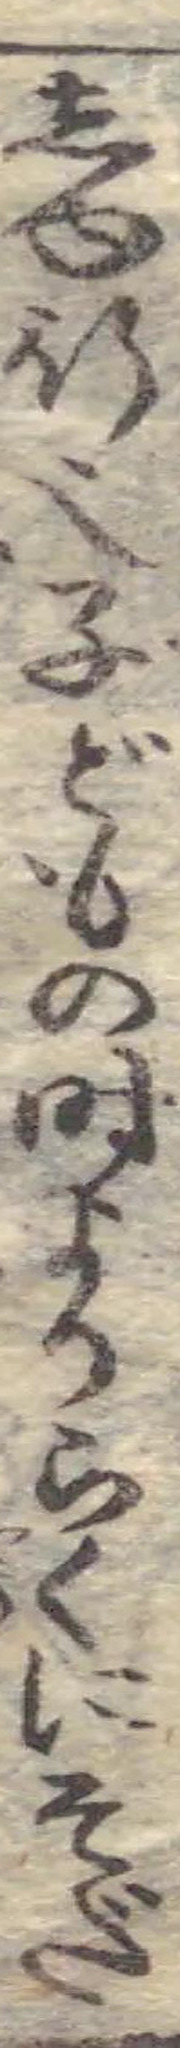しゆ行也子どもの時よりらくにそだ
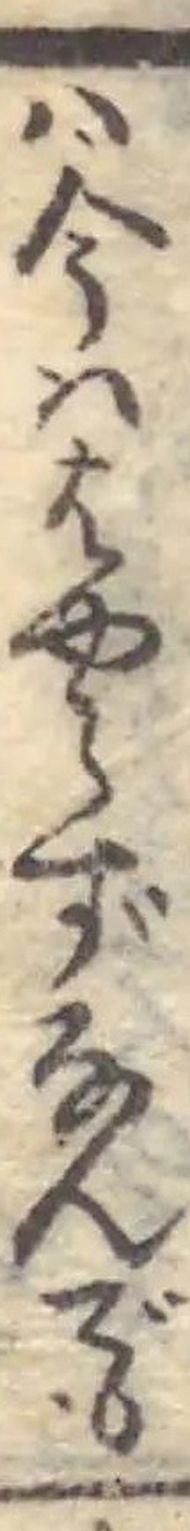は今ははやらずなんでも
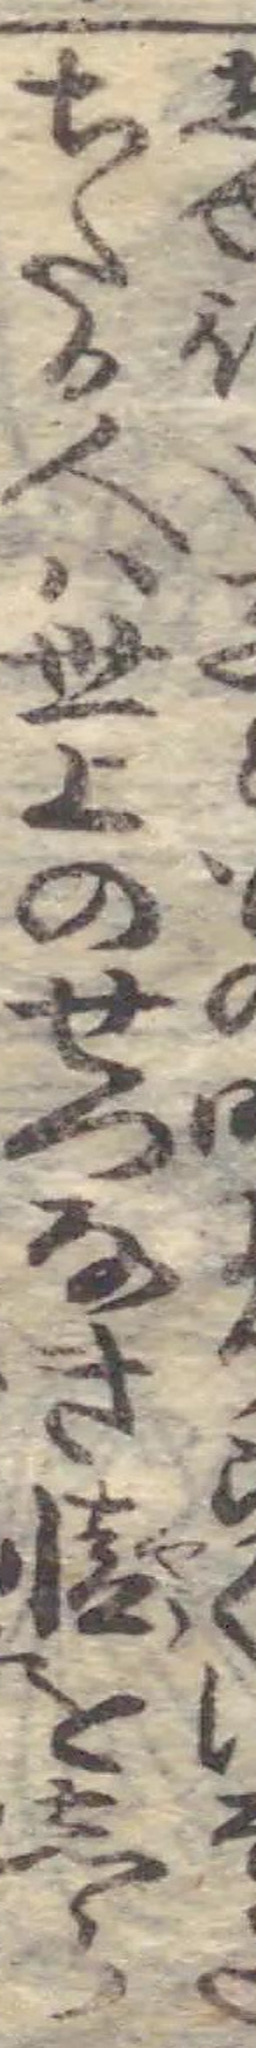ちたる人は世上のせつなさ情を知ら
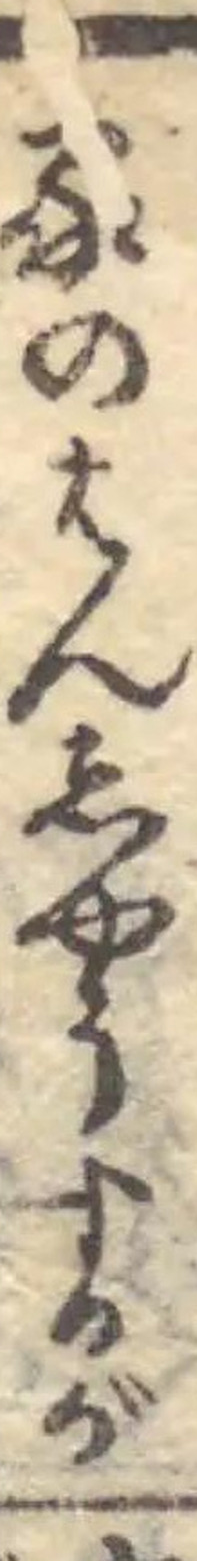家のはんしやうするが
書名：大通人好記
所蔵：国立国会図書館 National Diet Library, JAPAN
